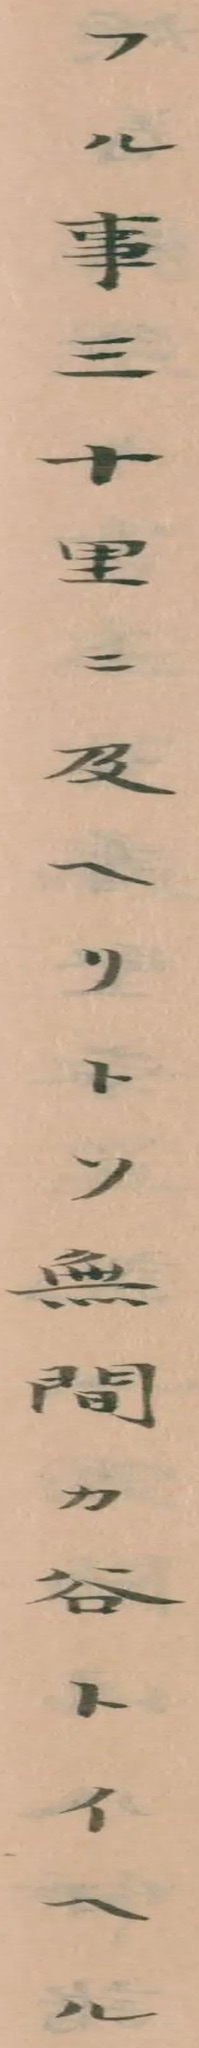フル事三十里二及ヘリトソ無間ヵ谷トイへル
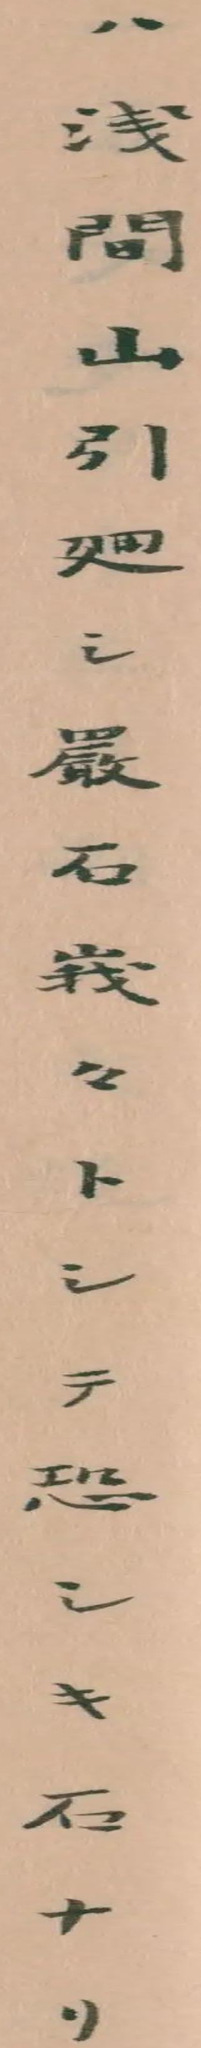ハ浅間山引廻シ巌石峩々トシテ恐シキ石ナリ
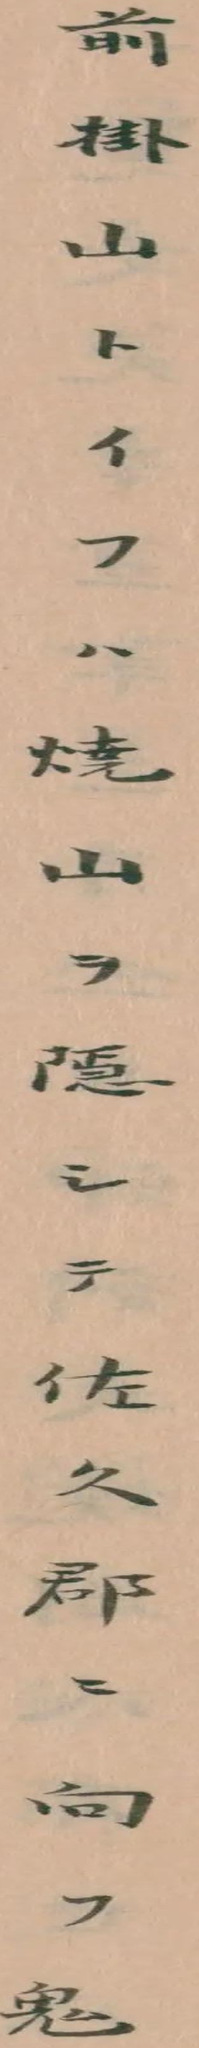前掛山トイフハ焼山ヲ隠シテ佐久郡二向フ鬼
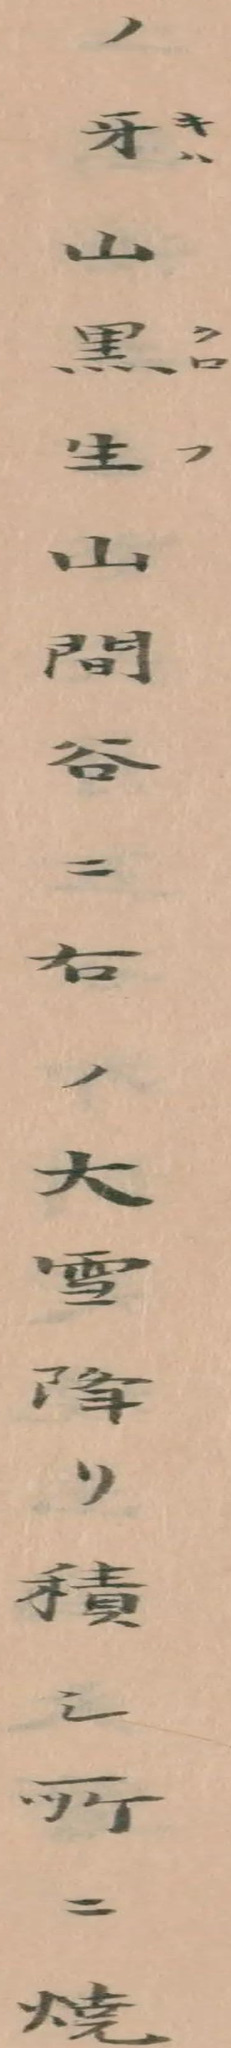ノ牙山黒生山間谷二右ノ大雪降り積シ所二焼
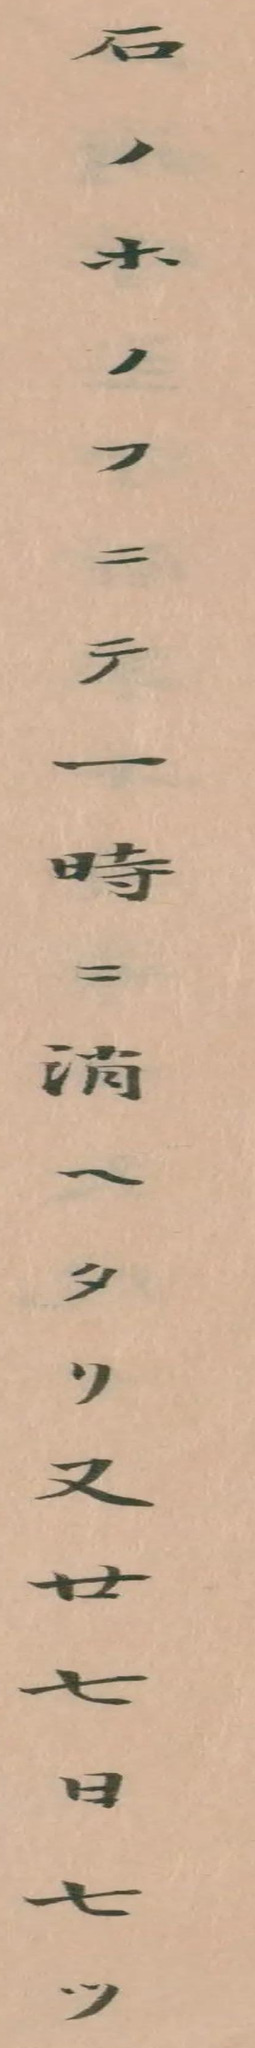石ノホノフニテ一時二消へタリ又廿七日七ッ
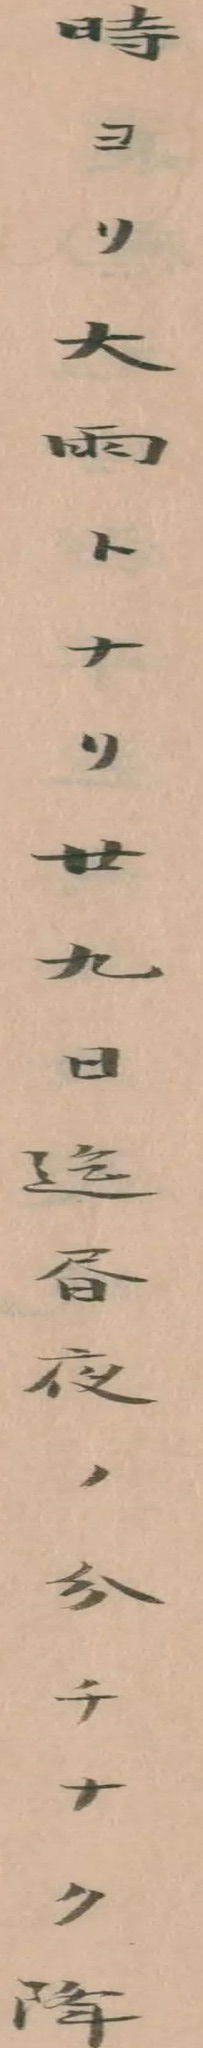時ヨリ大雨トナリ廿九日迄昼夜ノ分チナク降
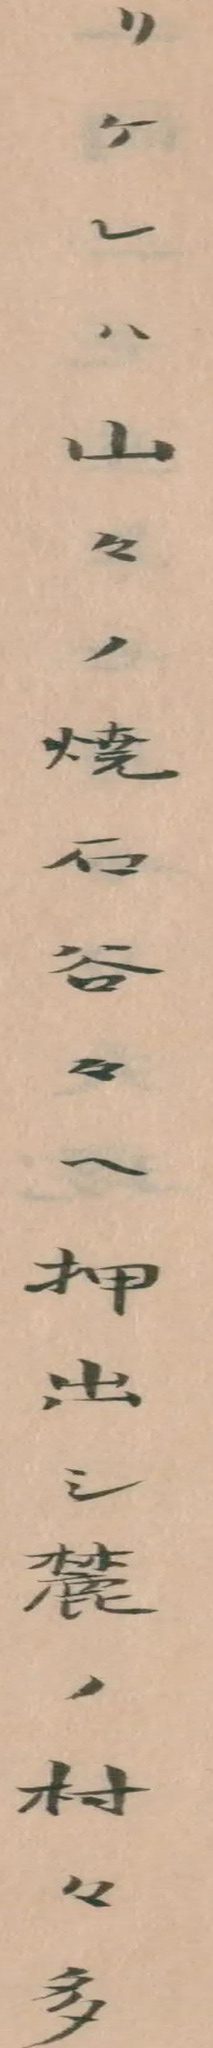リタレハ山々ノ焼石谷々へ押出シ麓ノ村々多
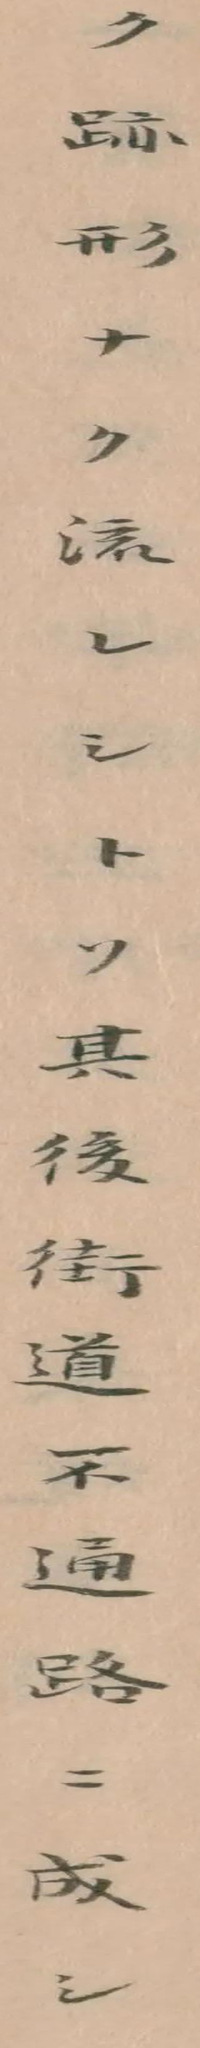ク跡形ナク流レシトソ其後街道不通路二成シ
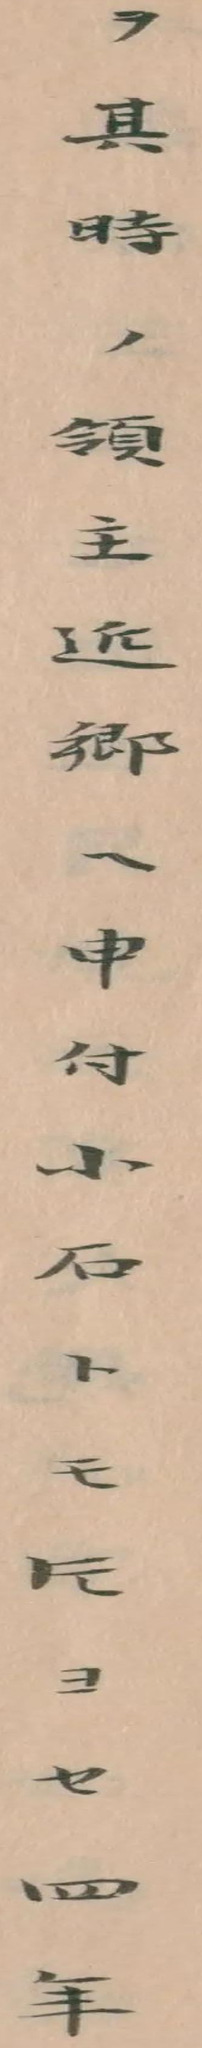ヲ其時ノ領主近郷へ申付小石トモ片ヨセ四年
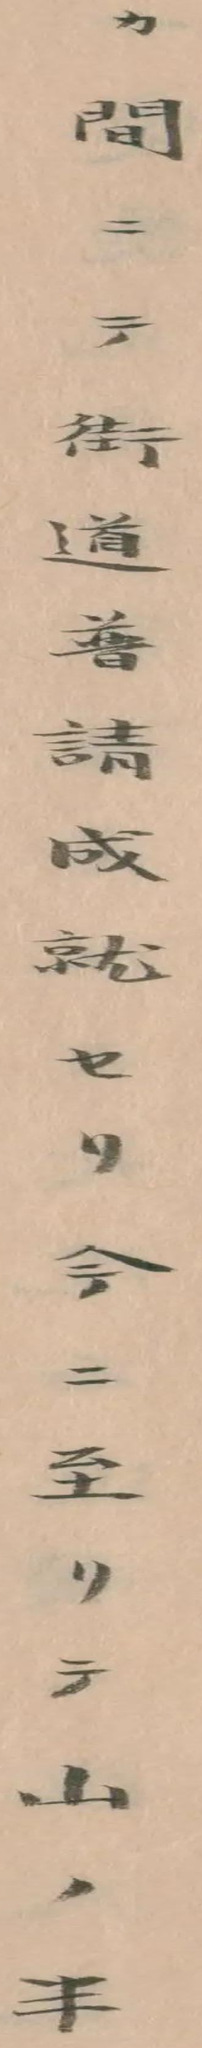ノ間ニテ街道普請成就セリ今二至リテ山ノ半
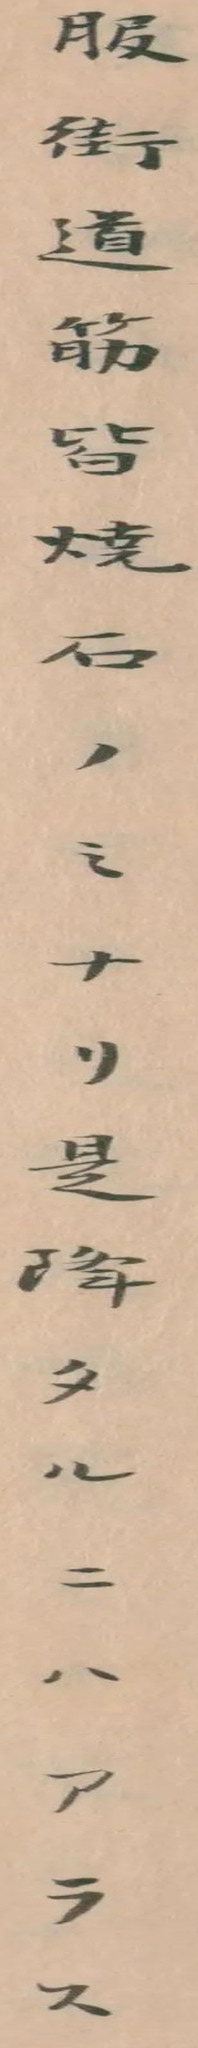服街道筋皆焼石ノミナリ是降タル二ハアラス

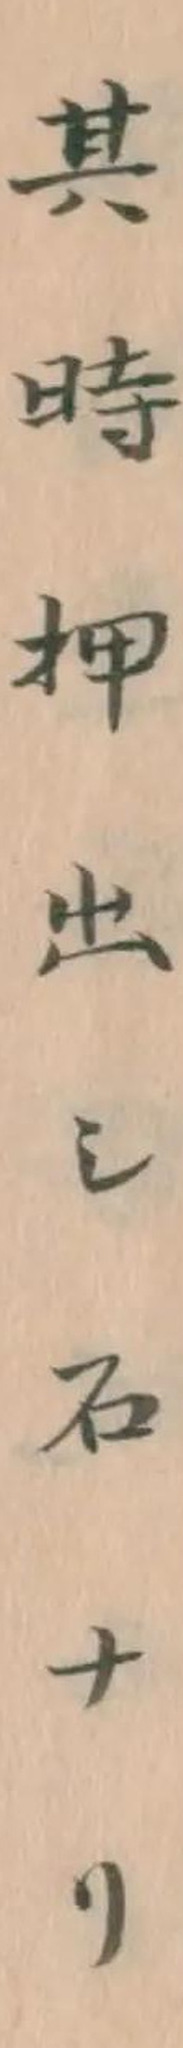其時押出シ石ナリ
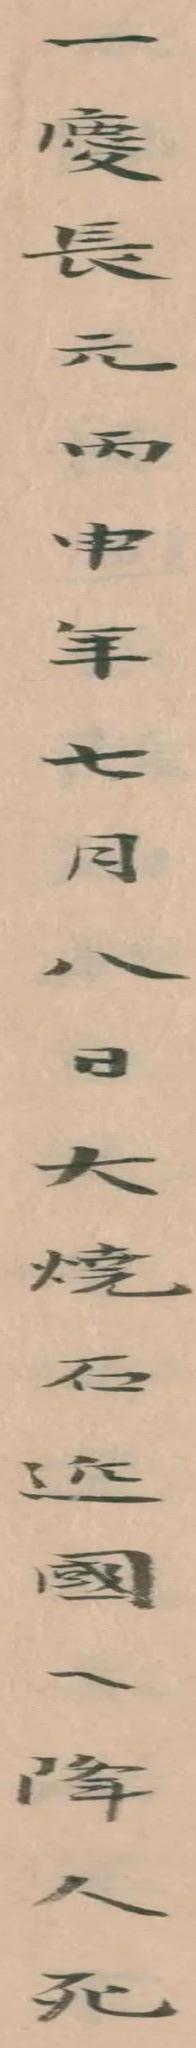一慶長元丙申年七月八日大焼石近国へ降人死
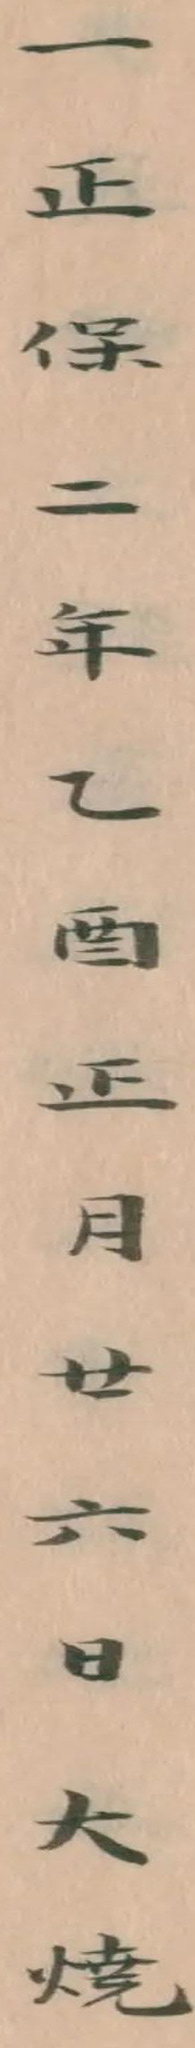一正保二年乙酉正月廿六非日大焼
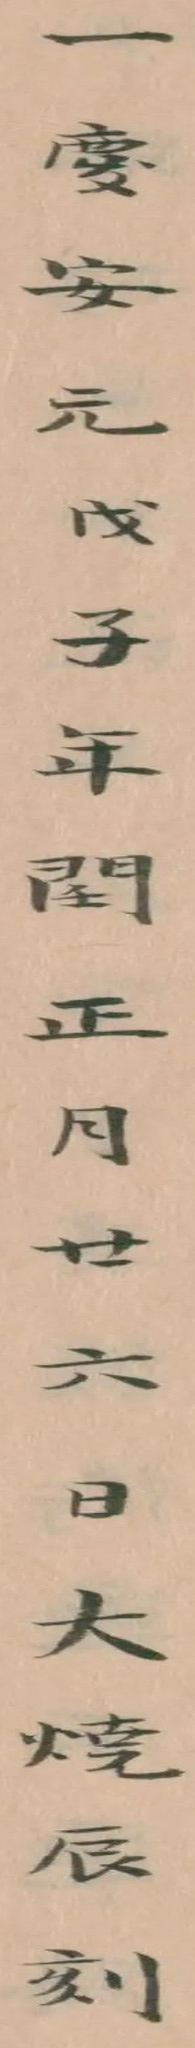一慶安元戌子年閏正月廿六日大焼辰刻
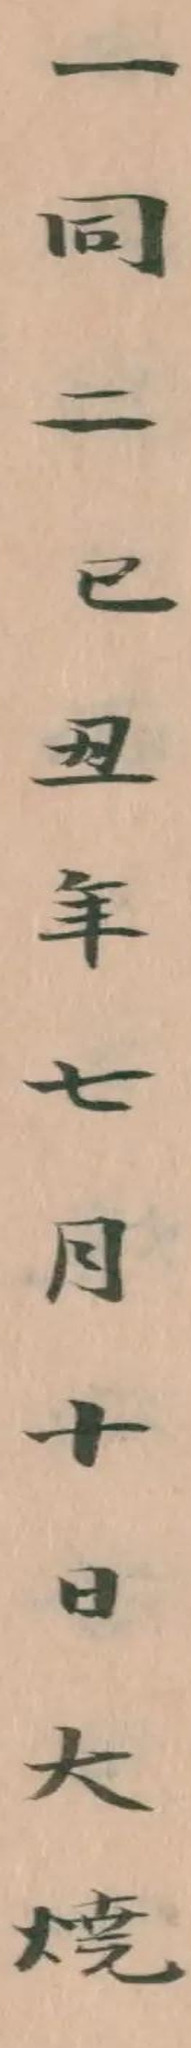一同二己丑年七月十日大焼
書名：地災撮要. 巻3(地震之部)-巻4(噴火之部)
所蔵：国立国会図書館 National Diet Library, JAPAN
